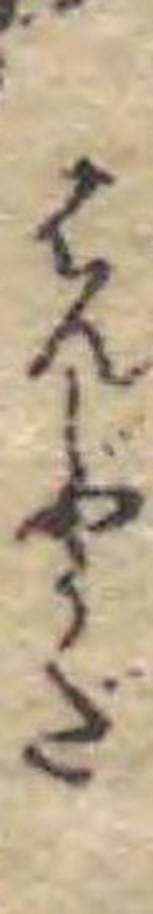はんじやうだ
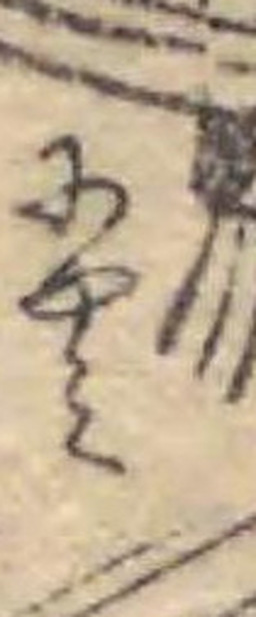にやみ
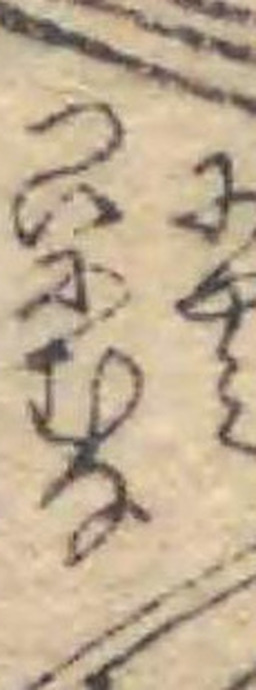ついにむな
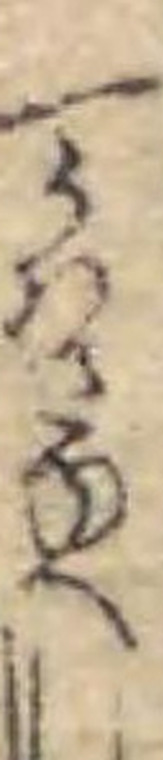うはさゆへ
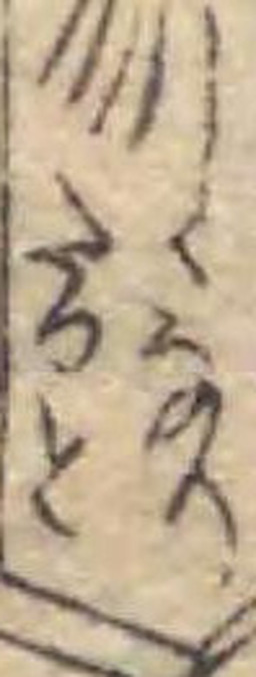たると
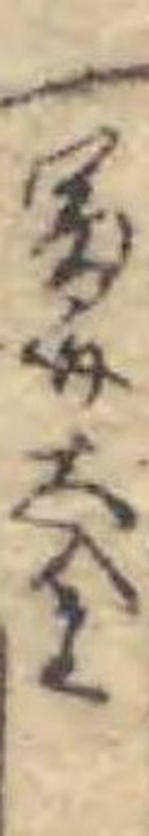富介大金
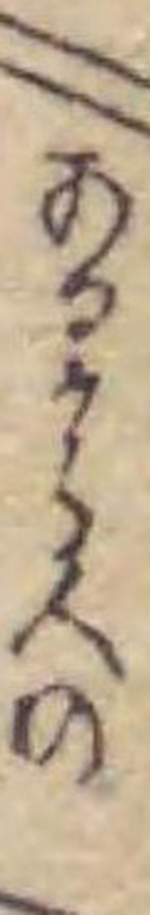あるから人の
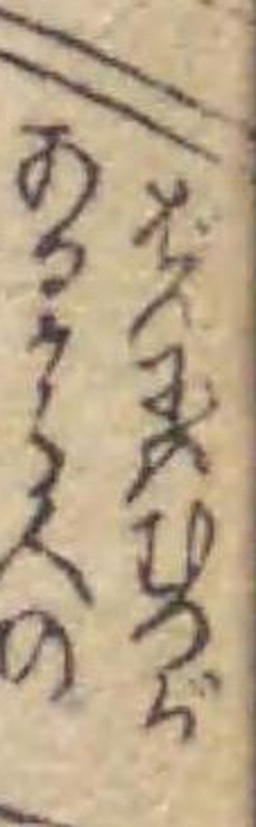あるから人の
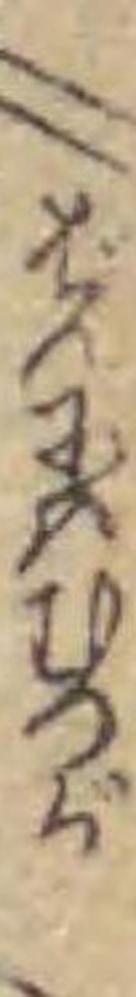ばんにはむつが
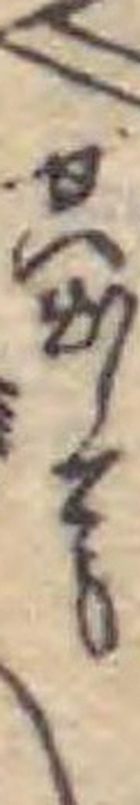せい出しても
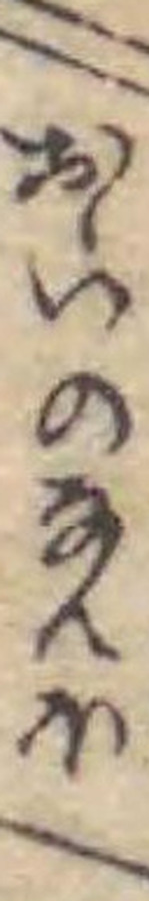おゝいのなんほ
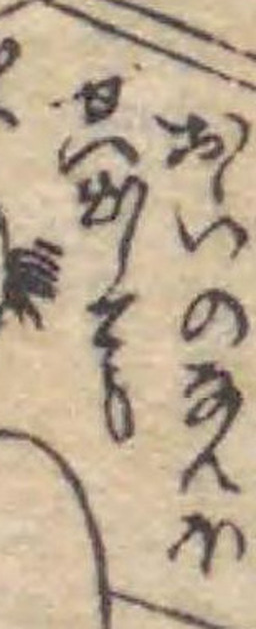せい出しても
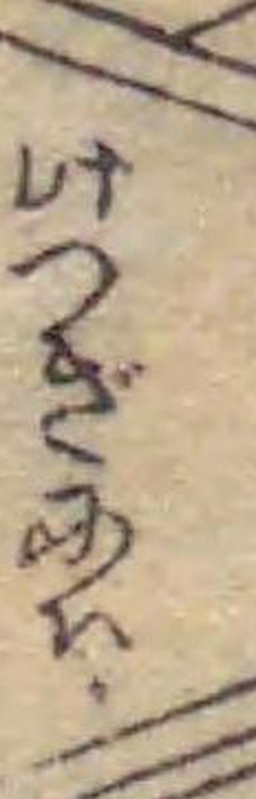此つぎには
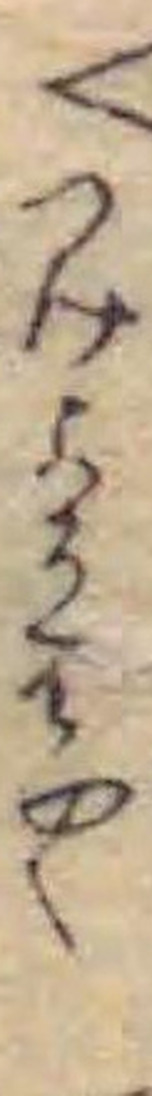つけようはやく
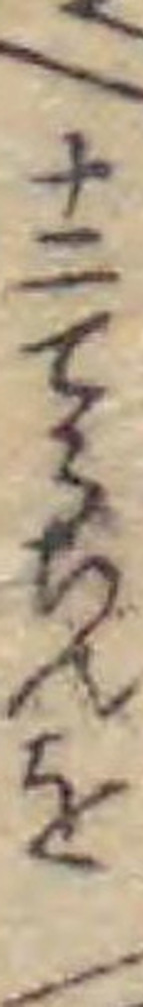十二てうちんを
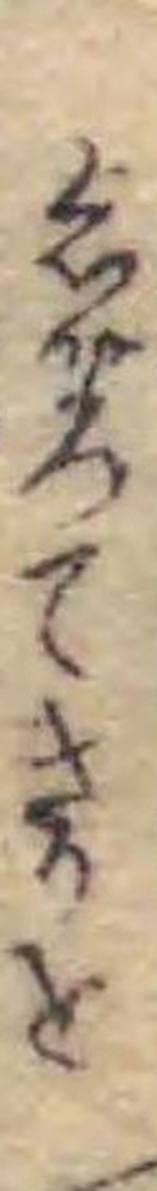しまつてきりを
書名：扨化狐通人 : 2巻
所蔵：国立国会図書館 National Diet Library, JAPAN
